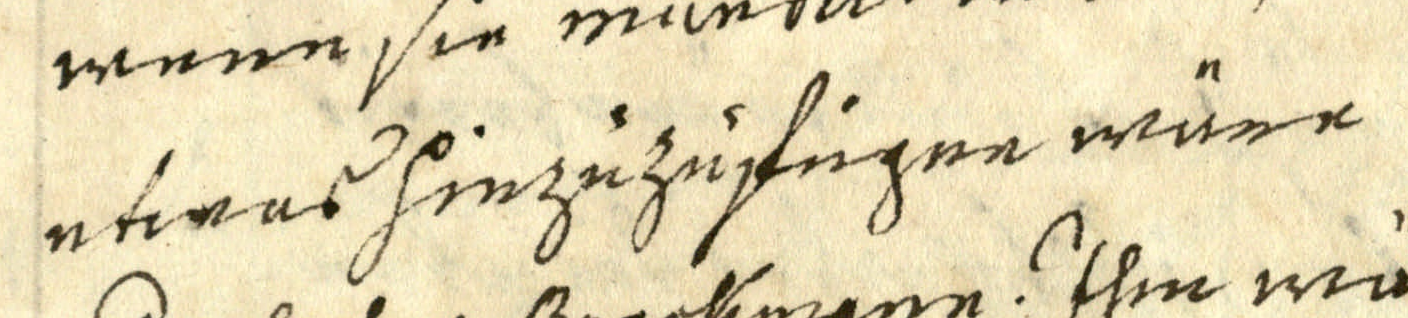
etwas hinzuzufügen wäre?
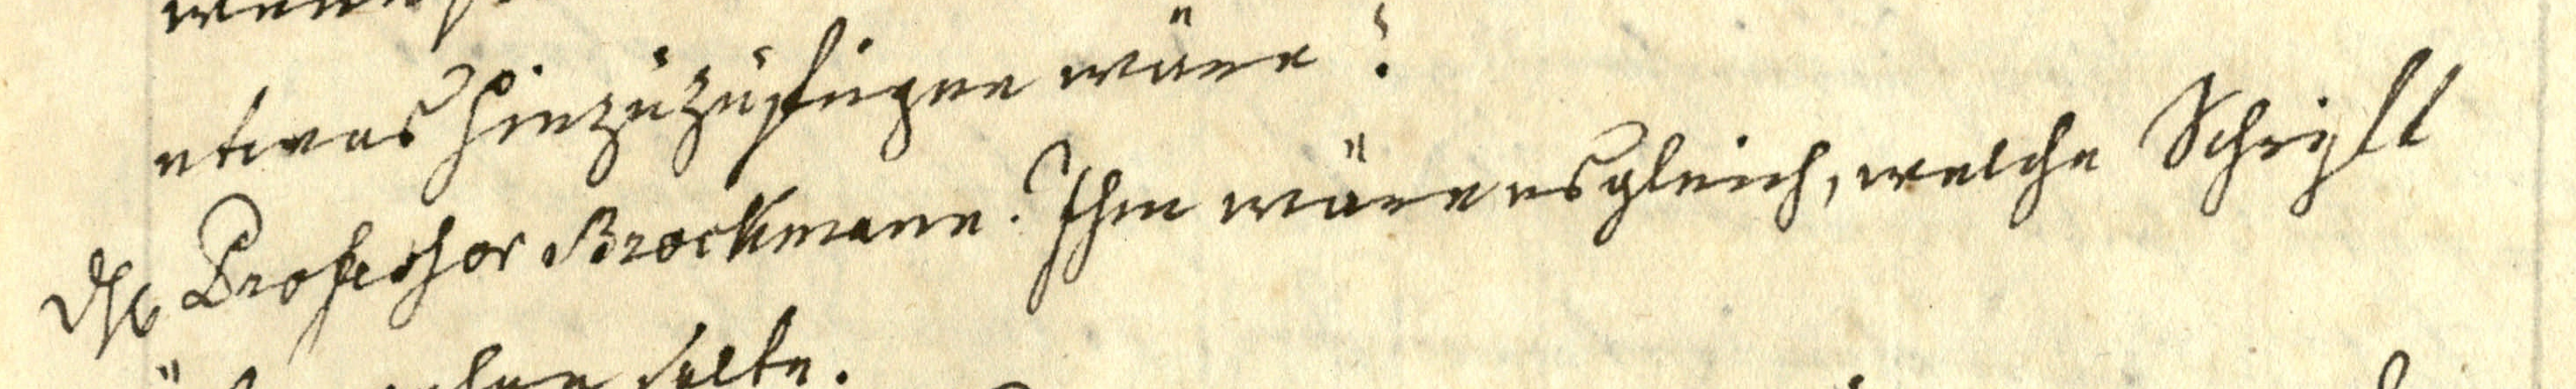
dh. Professor Brockmann. Ihm wäre es gleich, welche Schrift
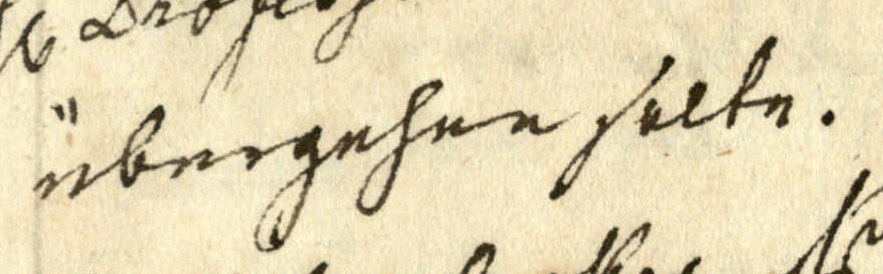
übergehen solte.
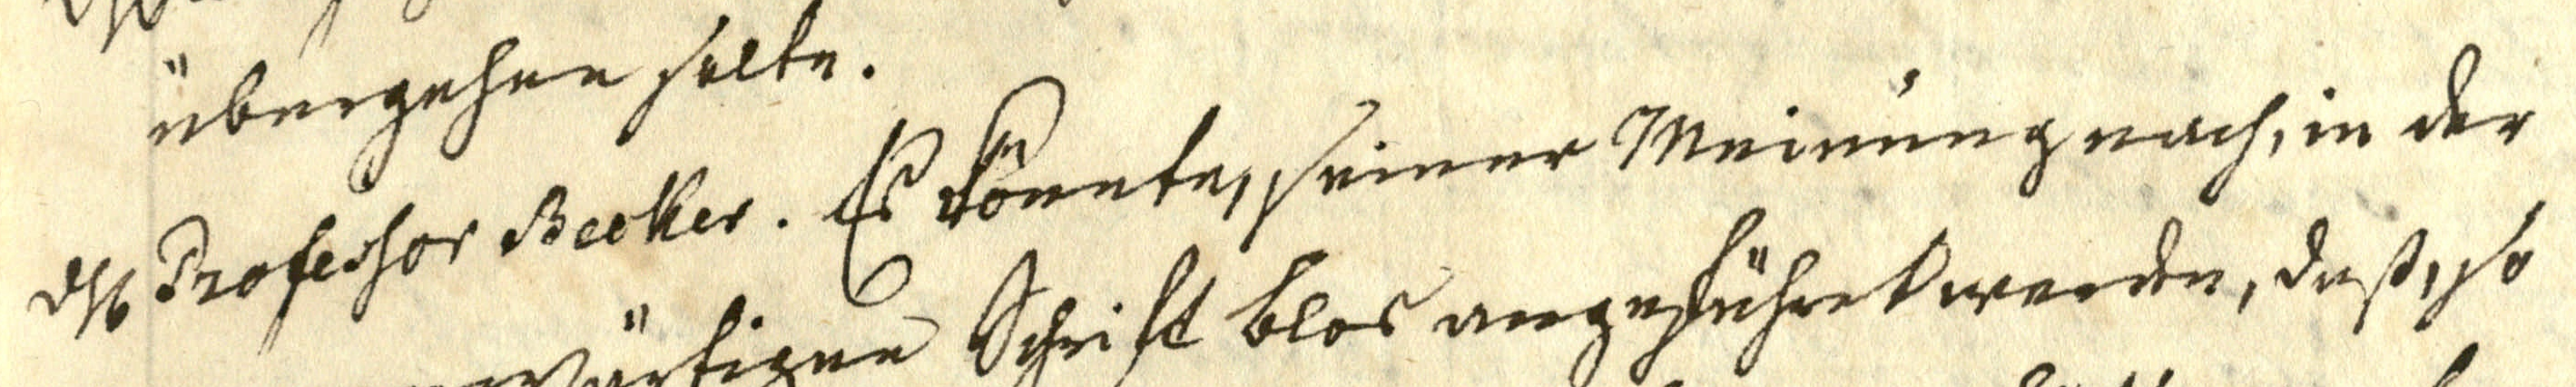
dh Professor Becker. Es könnte, seiner Meinungach, in der
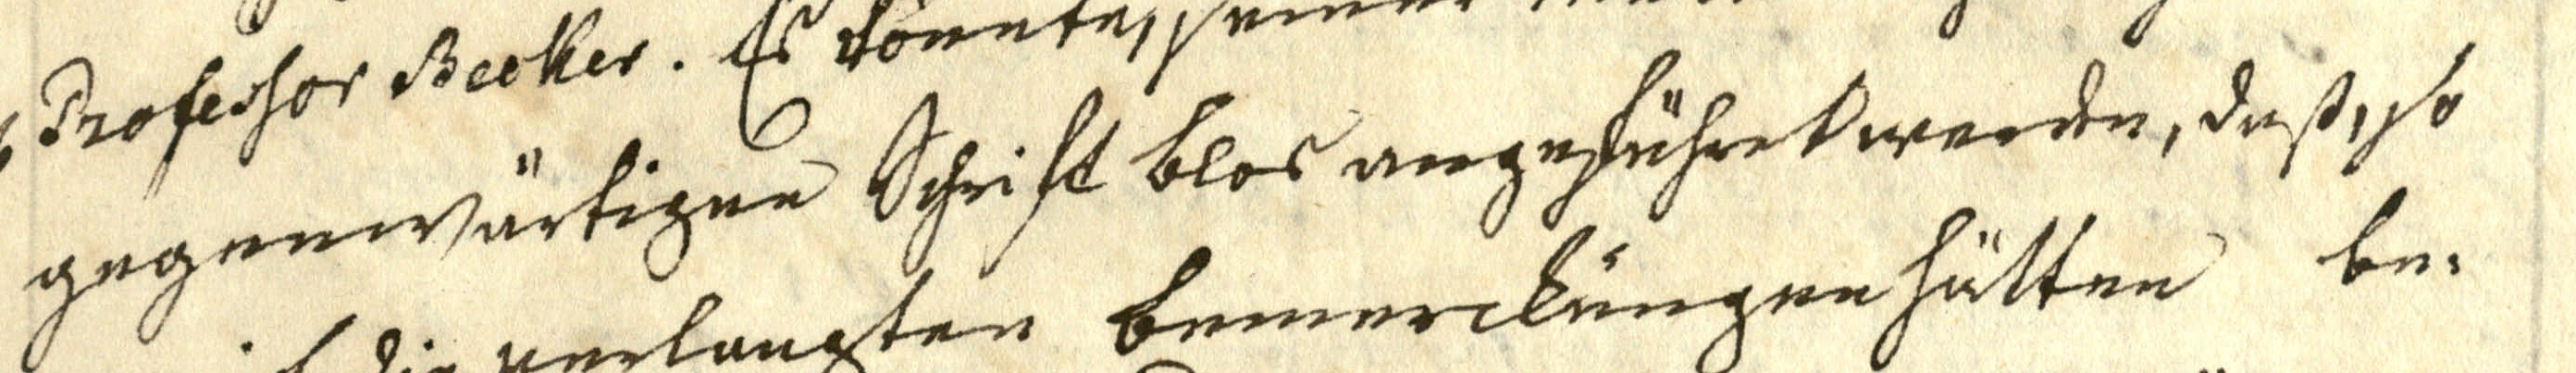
gegenwärtigen Schrift blos angeführet werden, daß, so
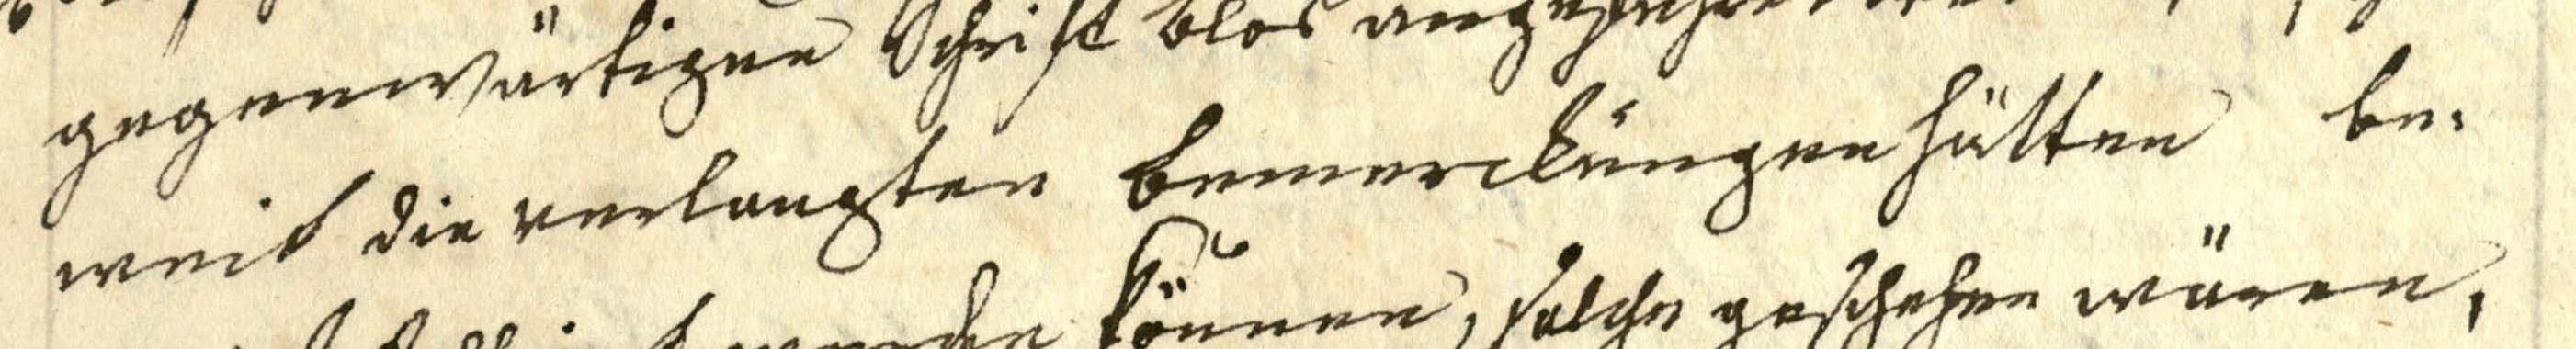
weit die verlangten Bemerckungen hätten be¬
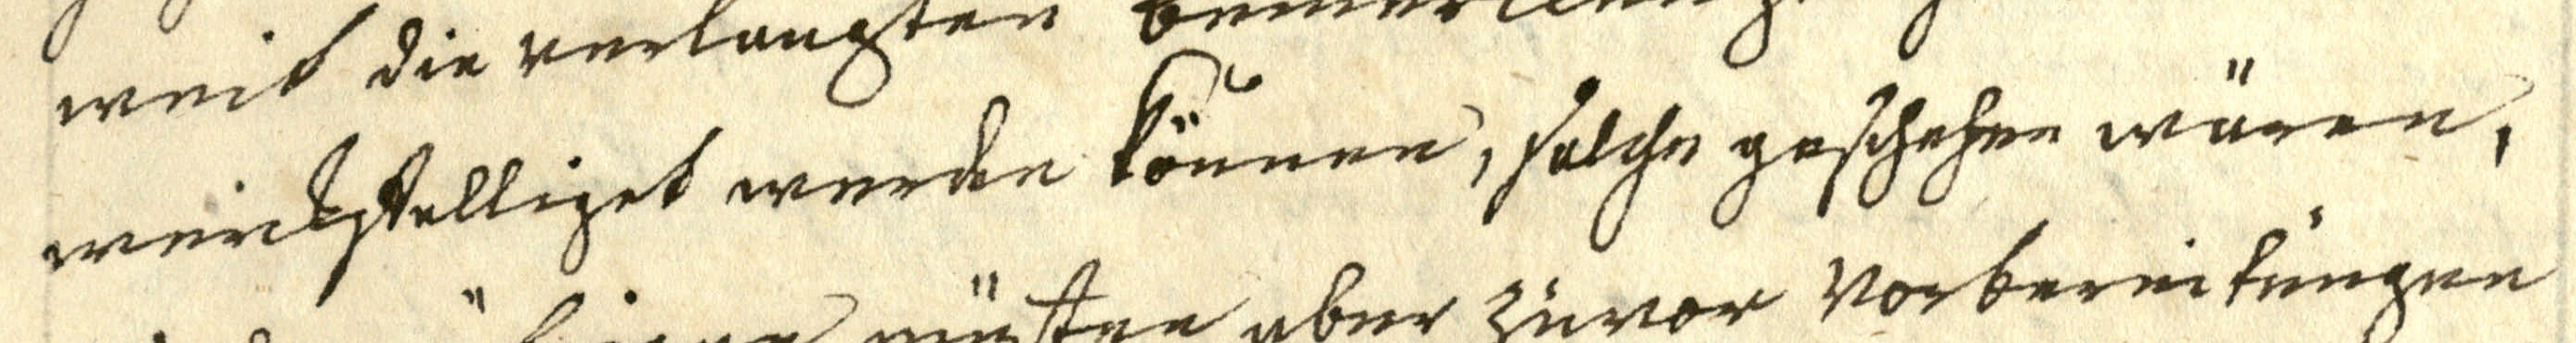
werkstelliget werden können, solche geschehen wären,
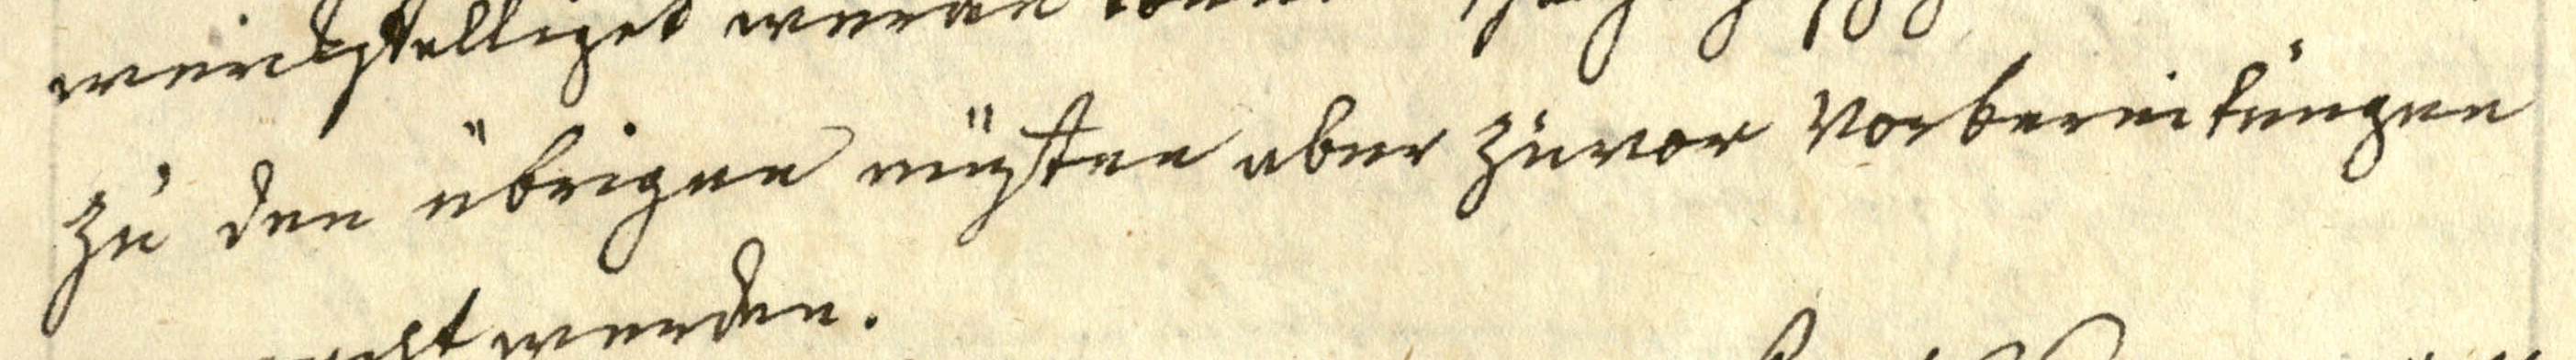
zu den übrigen müsten aber zuvor Vorbereitungen
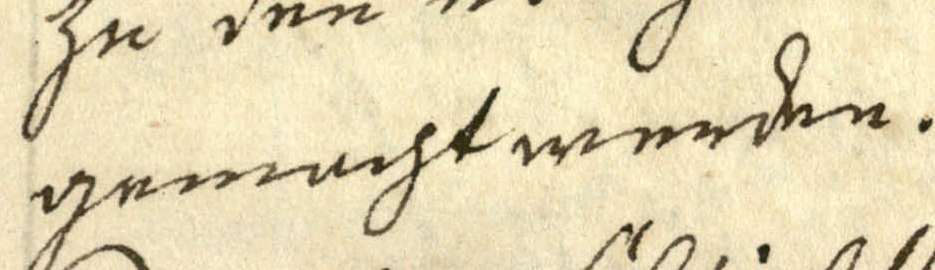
gemacht werden.
